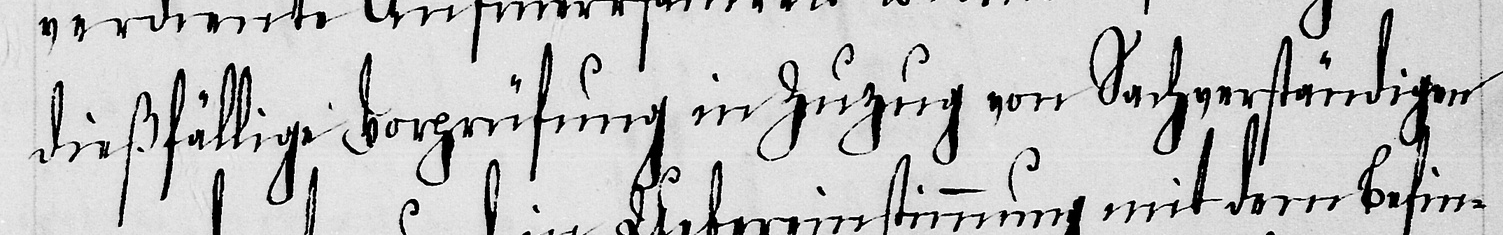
dießfällige Vorprüfung in Zuzug von Sachverständigen
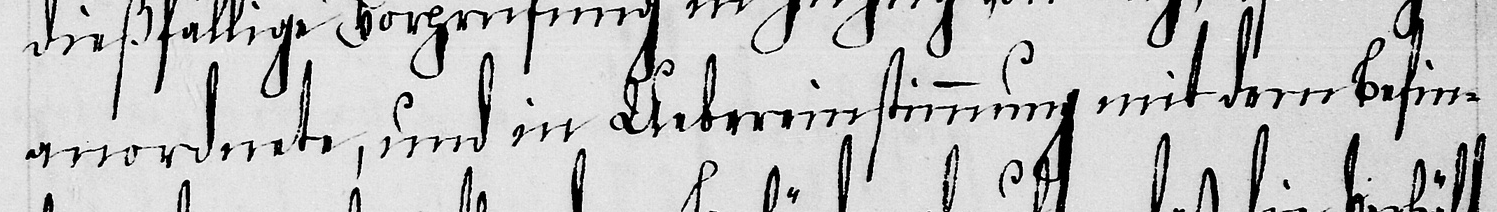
anordnete, und in Uebereinstimmung mit dem Befin¬
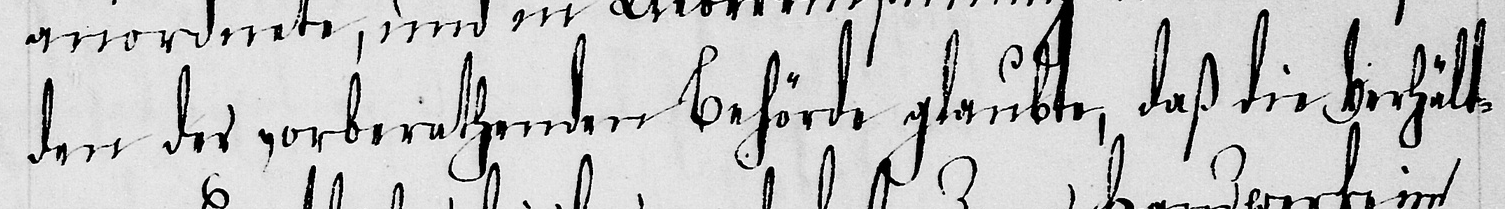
den der vorberathenden Behörde glaubte, daß die Verhäl¬
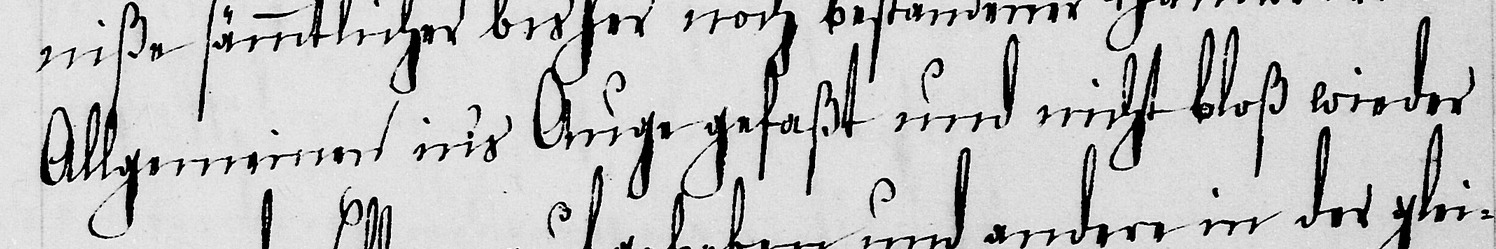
Allgemeinen in’s Auge gefaßt und nicht bloß wieder
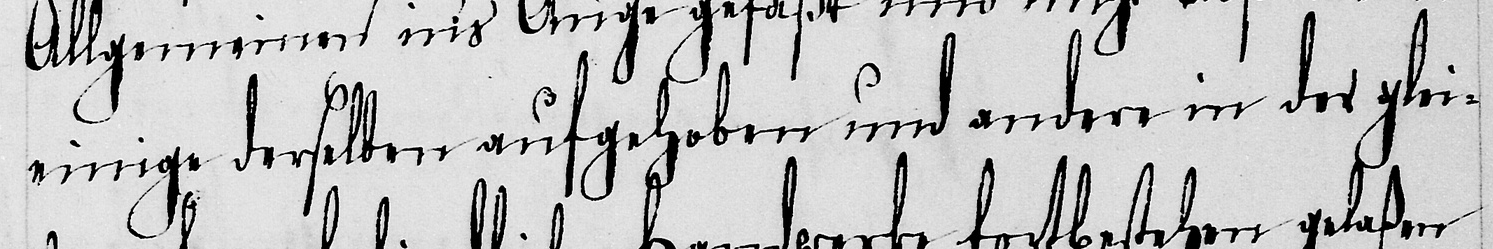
einige derselben aufgehoben und andere in der glei¬
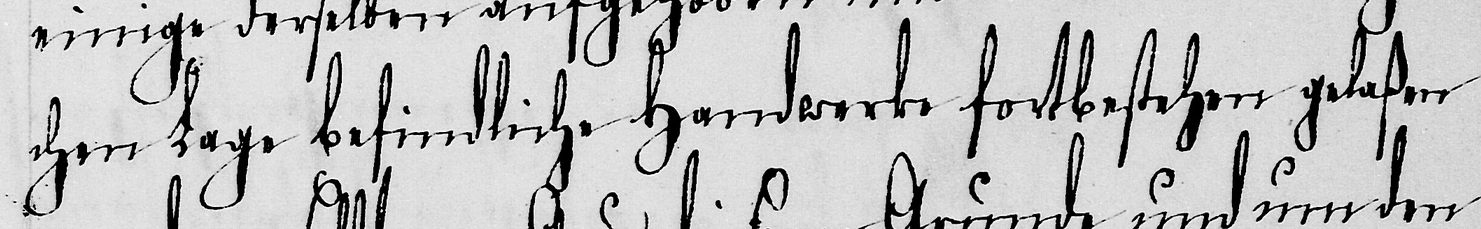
chen Lage befindliche Handwerke fortbestehen gelaßen
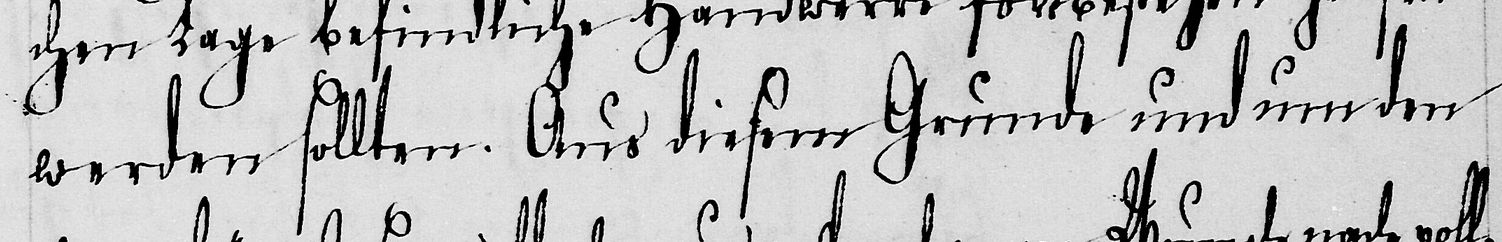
werden sollten. Aus diesem Grunde und um den
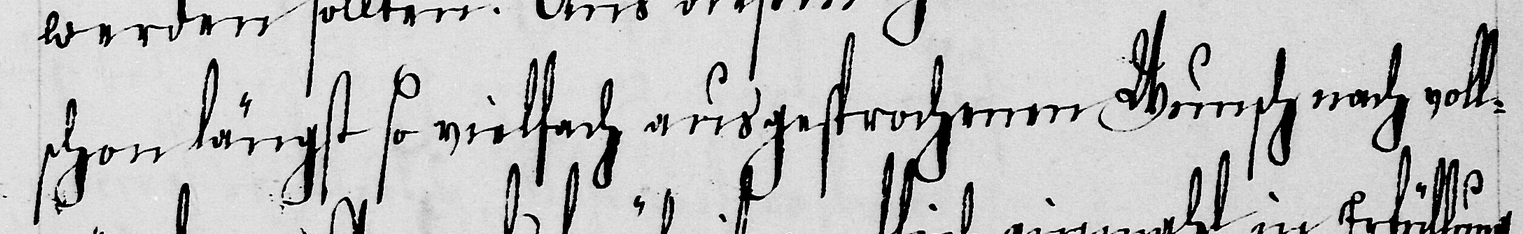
schon längst so vielfach ausgesprochenen Wunsch nach vol¬
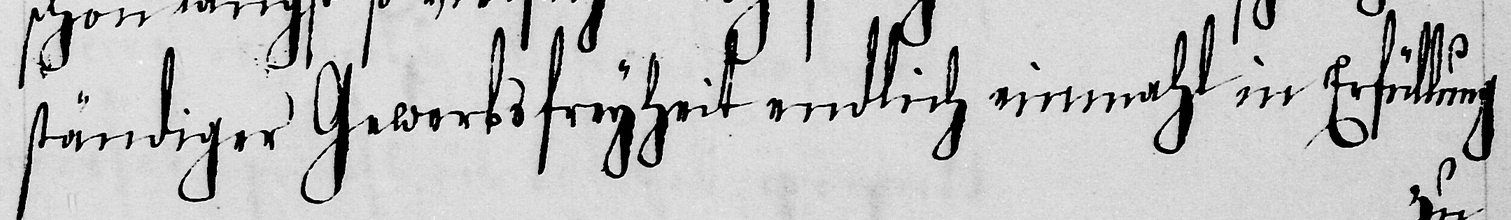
ständiger Gewerbsfreyheit endlich einmahl in Erfüllung
